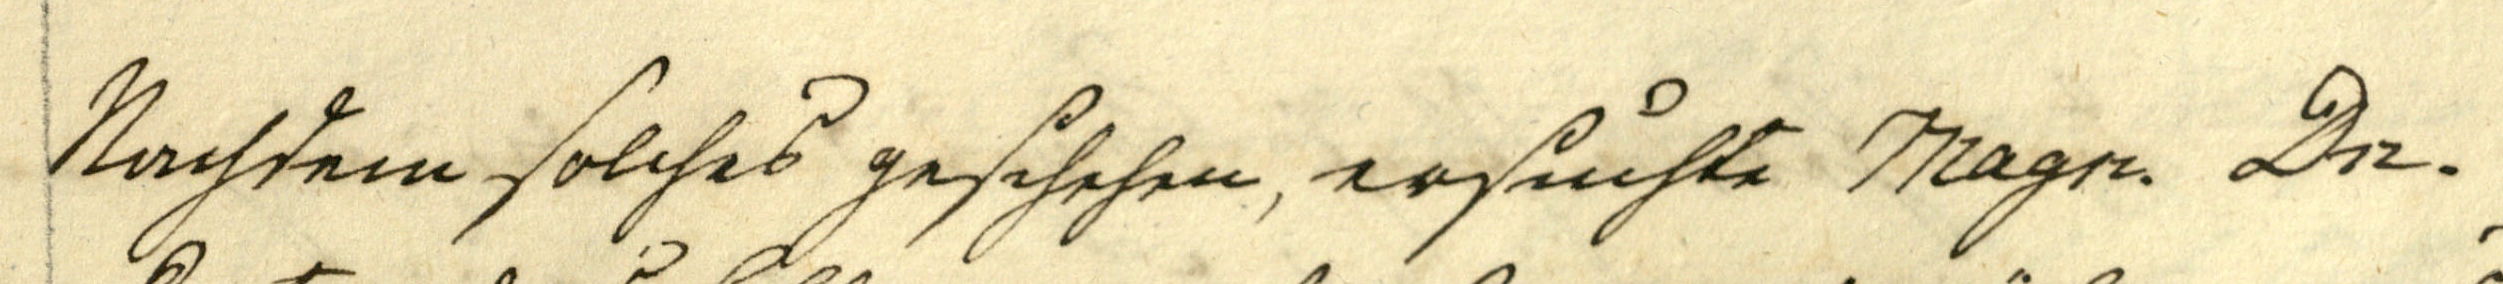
Nachdem solches geschehen, ersuchte Magn. Dn.
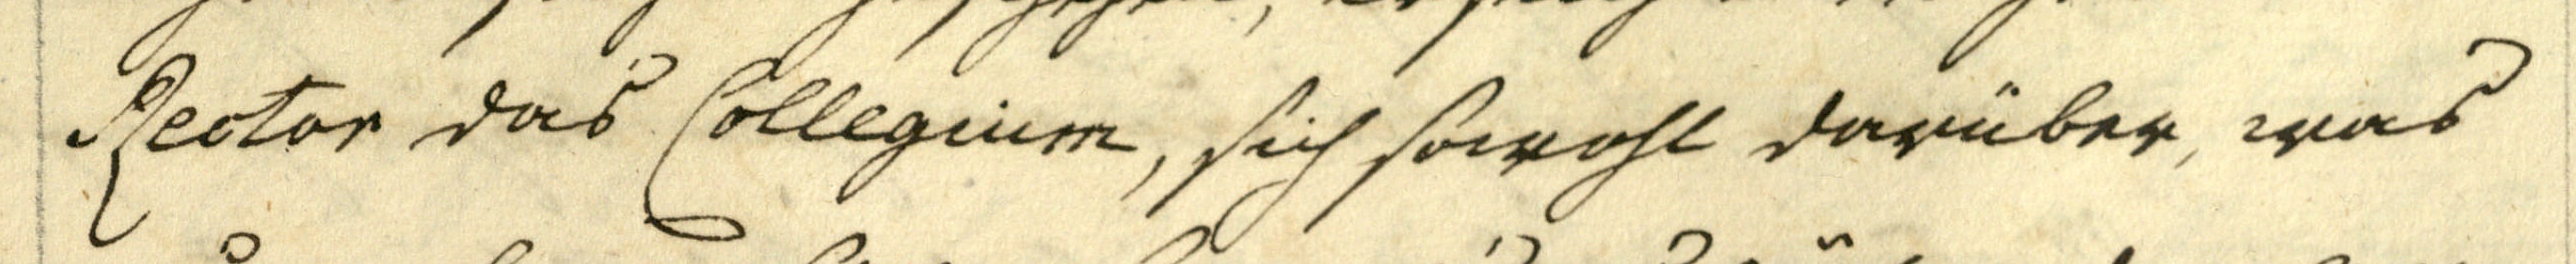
Rector das Collegium, sich sowohl darüber, was
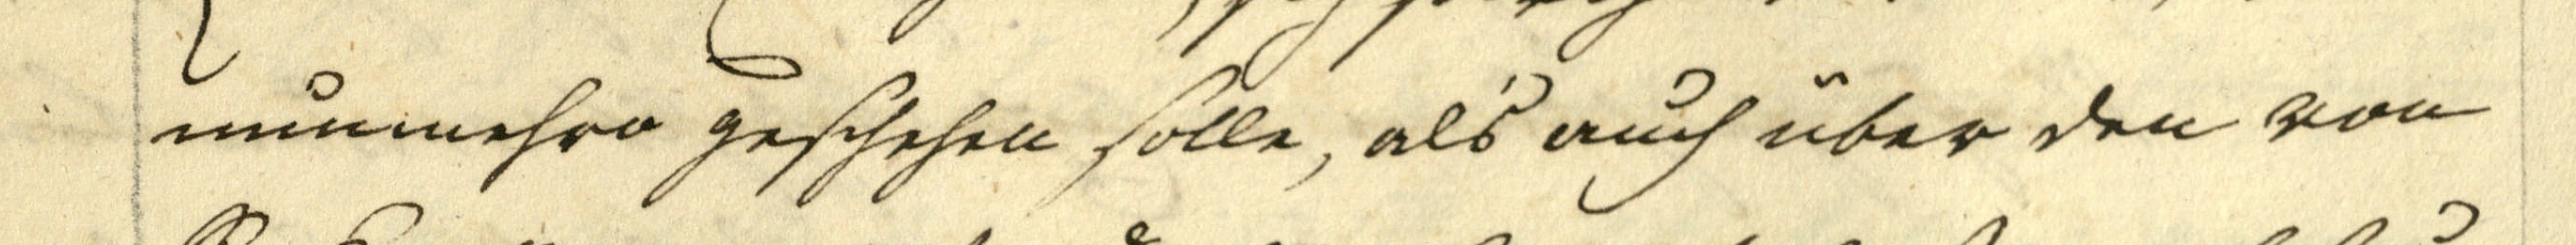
nunmehro geschehen solle, als auch über den von
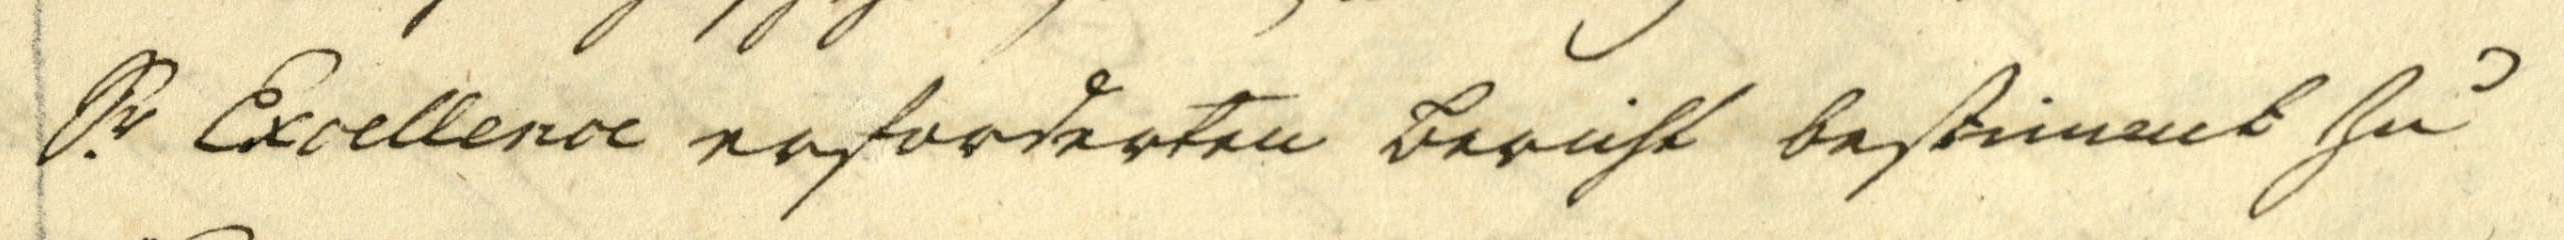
Sr Excellence erforderten Bericht bestimmt zu
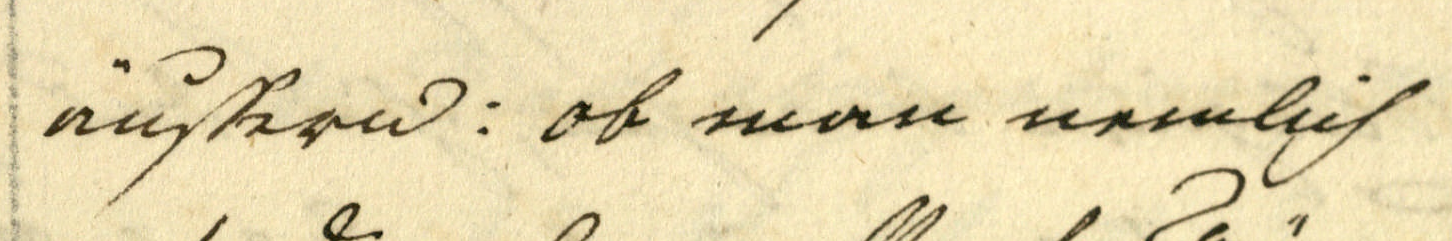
äussern: ob man nemlich
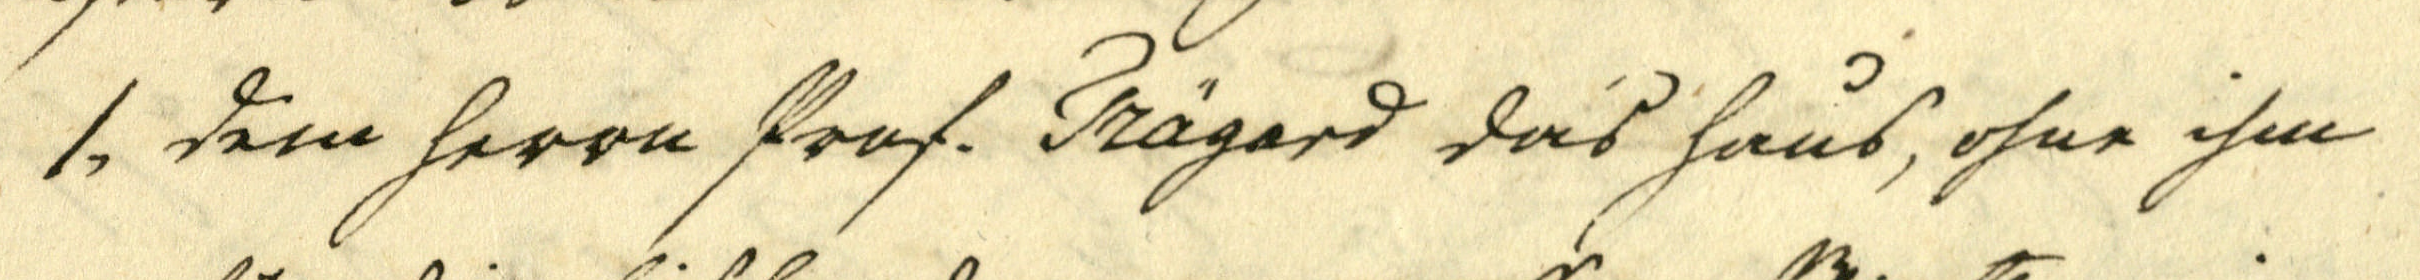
1. dem Herrn Prof. Trägård das Haus, ohne ihm
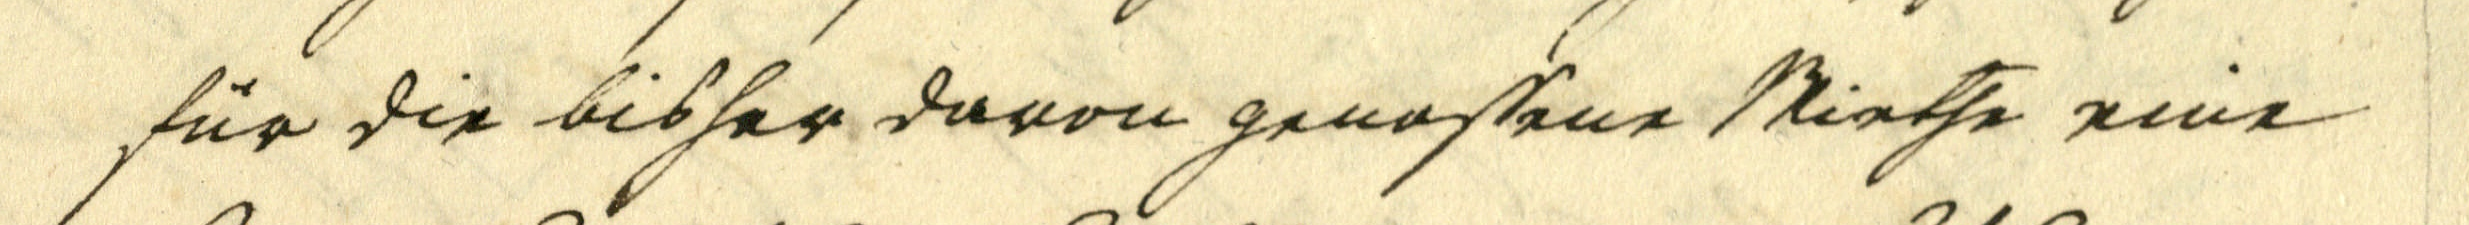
für die bisher davon genossene Miethe eine
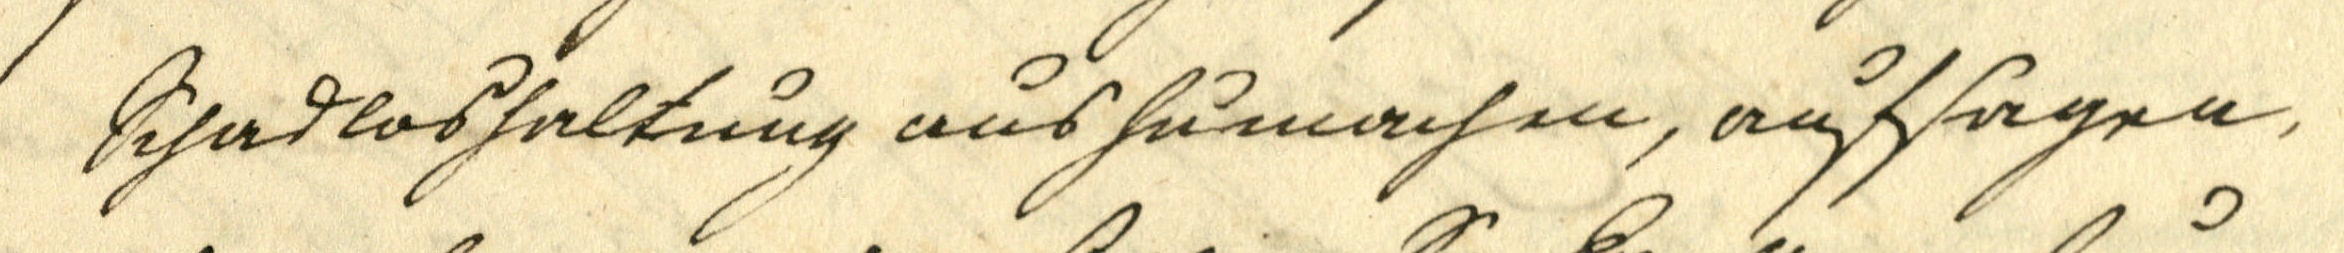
Schadloshaltung aus zumachen, aufsagen,
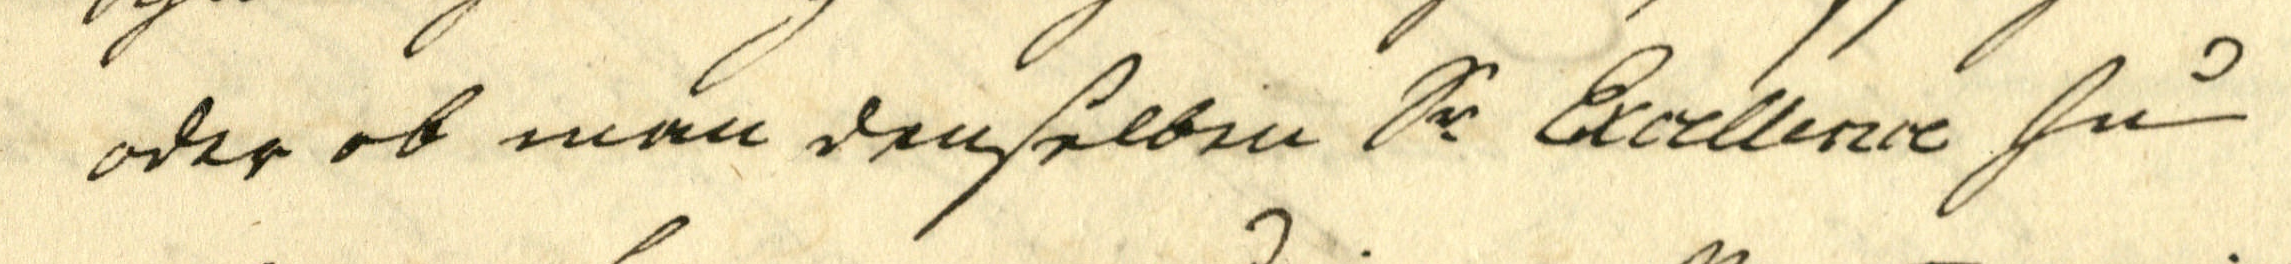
oder ob man denselben Sr Excellence zu
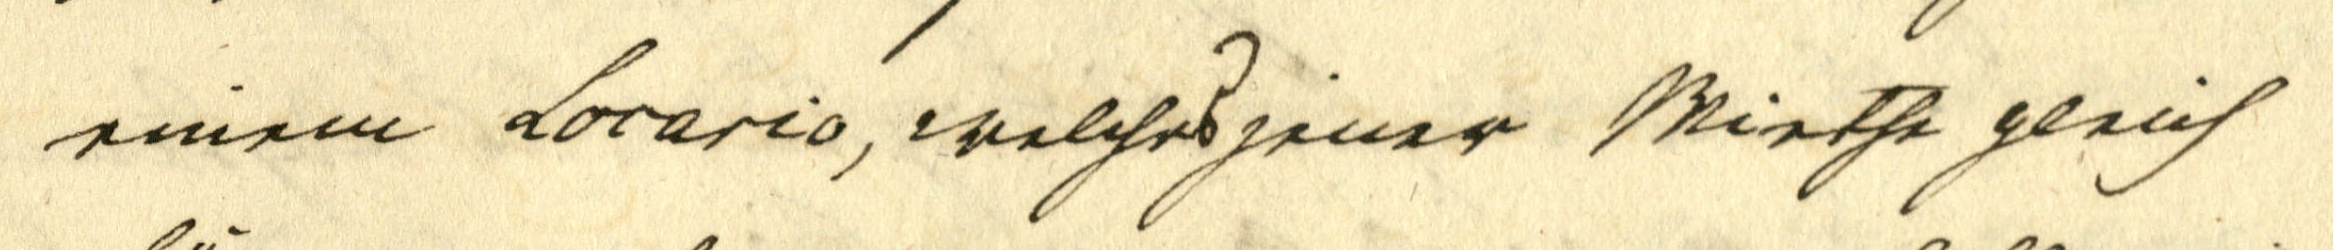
einem Locario, welches jener Miethe gleich
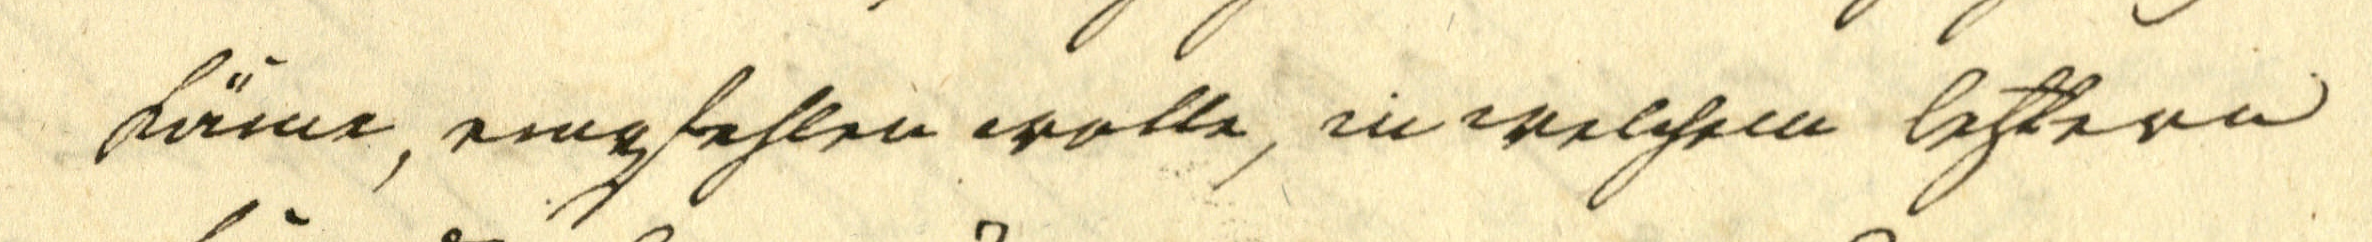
käme, empfehlen wolle, in welchem letztern
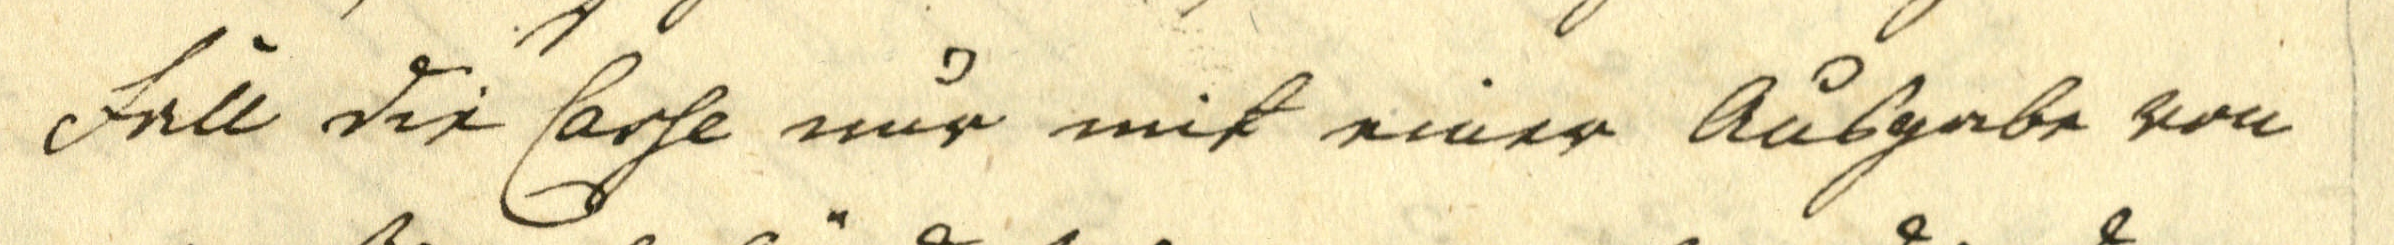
Fall die Casse nur mit einer Ausgabe von
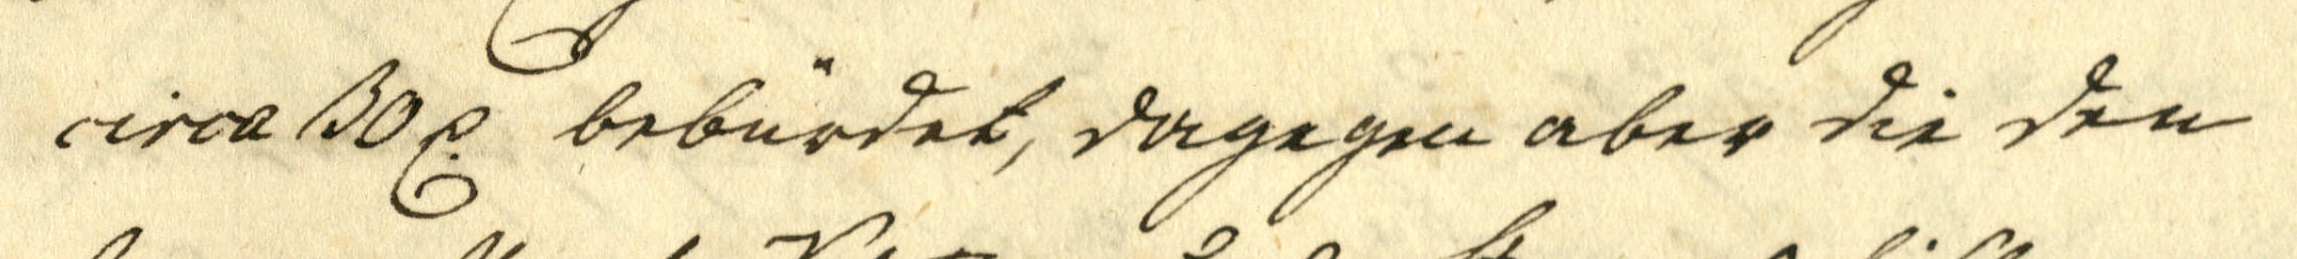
circa 30 l. bebürdet, dagegen aber die den
